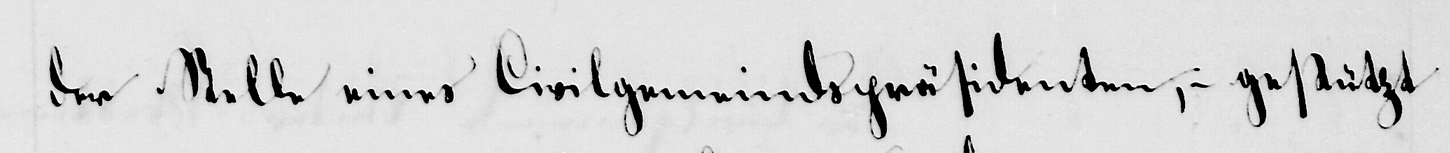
der Stelle eines Civilgemeindspräsidenten, – gestützt
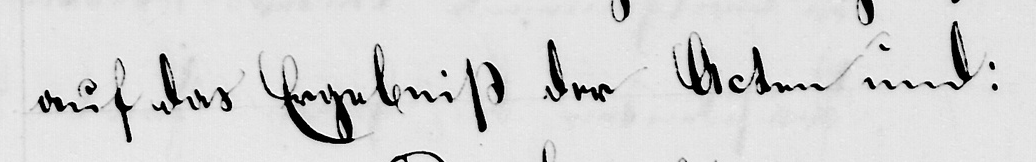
auf das Ergebniß der Acten und:
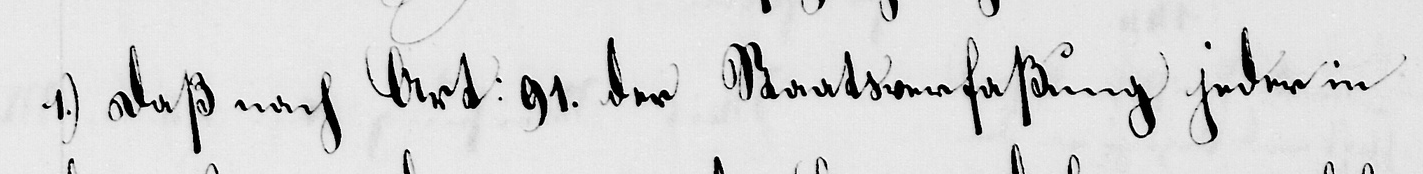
1.) Daß nach Art: 91. der Staatsverfaßung jeder in
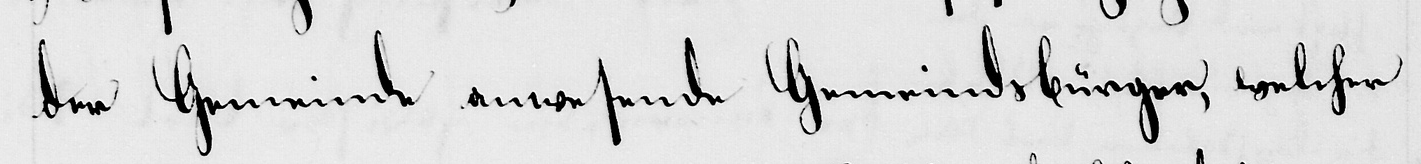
der Gemeinde anwesende Gemeindsbürger, welcher
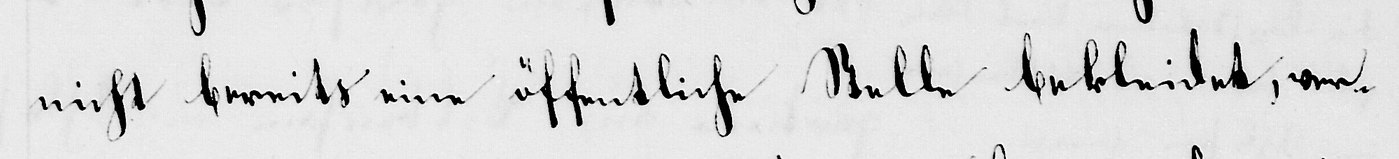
nicht bereits eine öffentliche Stelle bekleidet, ver¬
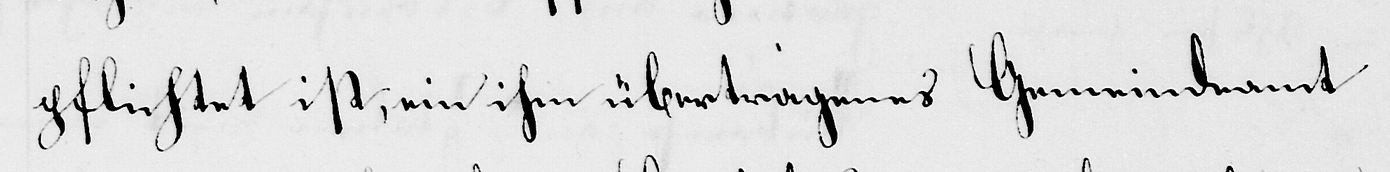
pflichtet ist, ein ihm übertragenes Gemeindeamt
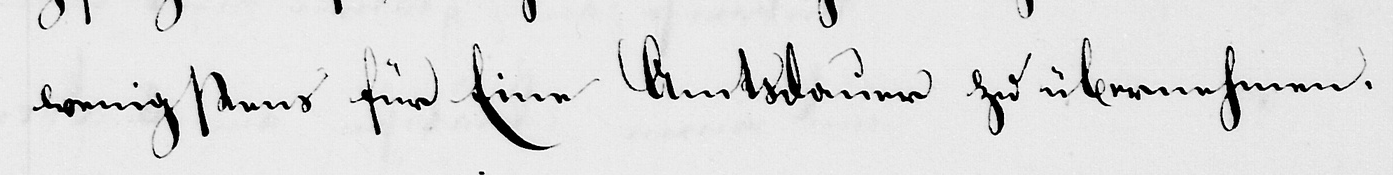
wenigstens für Eine Amtsdauer zu übernehmen.
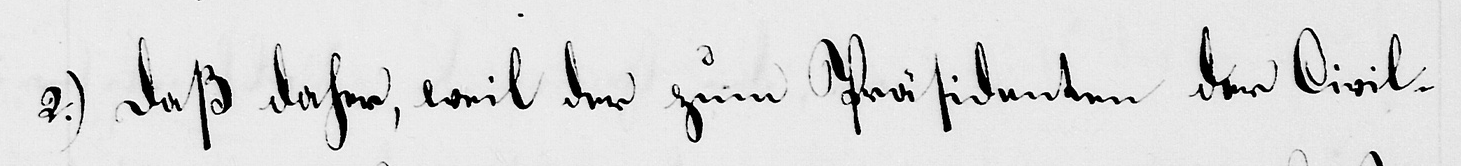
2.) Daß daher, weil der zum Präsidenten der Civil¬
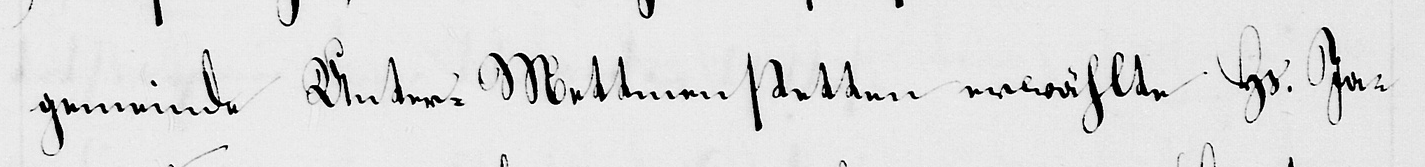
gemeinde Unter-Mettmenstetten erwählte Hs. Jac¬
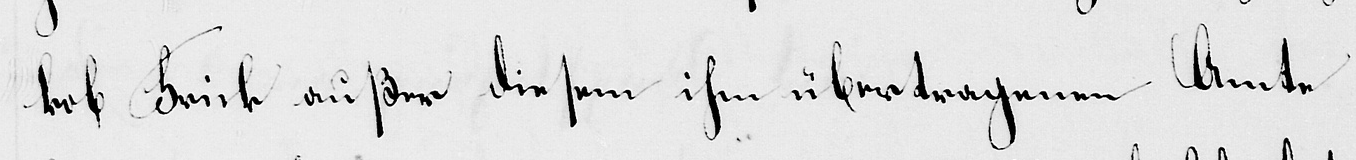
ob Frick außer diesen ihm übertragenen Amte
